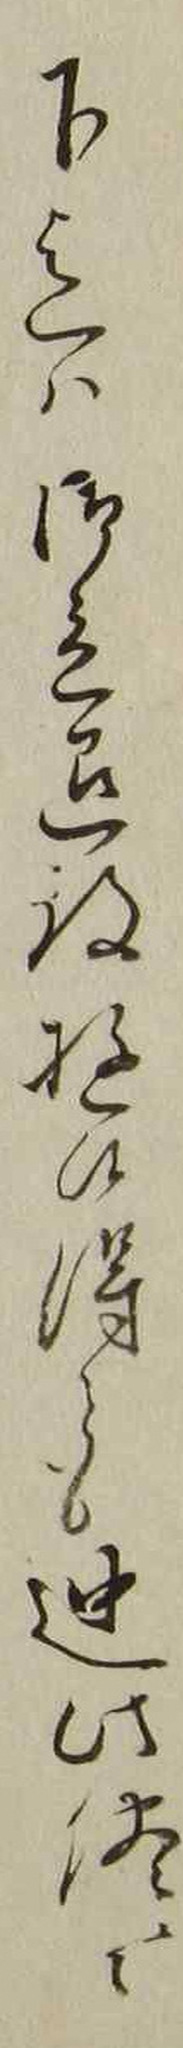下迄ハ御立退被遊候得とも迚此侭ニて
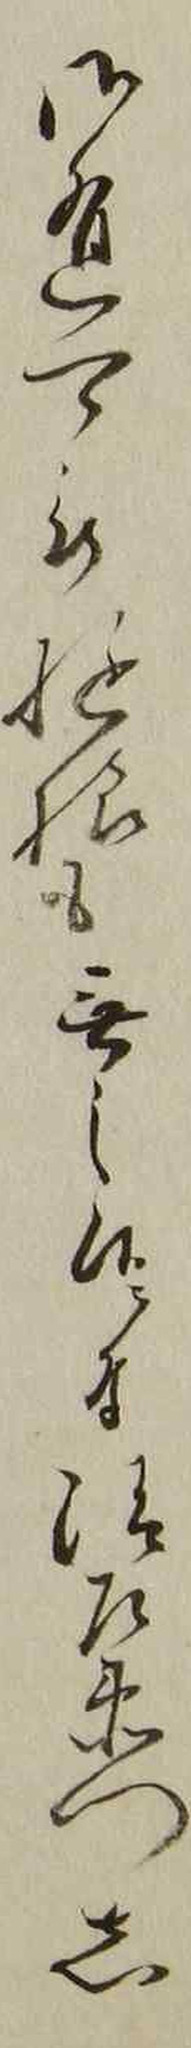御進可被遊様も無之候ニ付清左衛門し
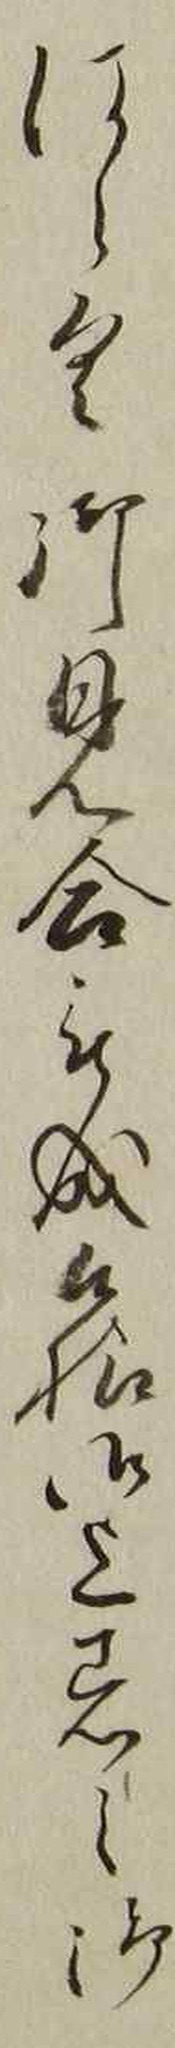はらく御見合被成候様御上着之御
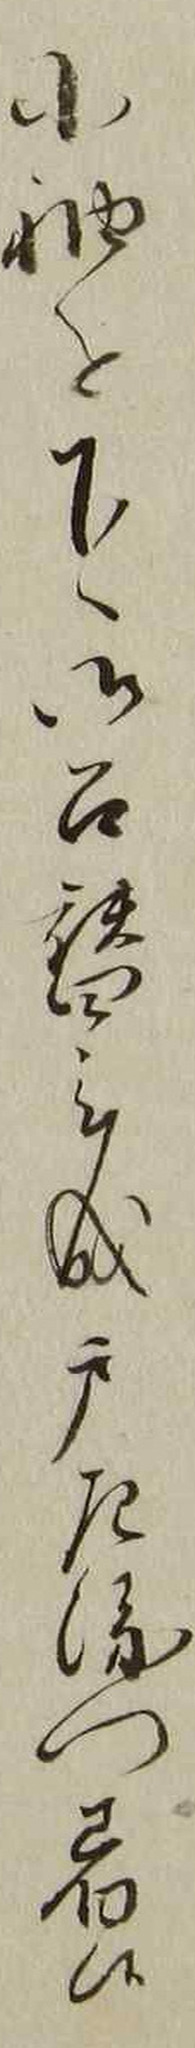小袖を下へ御召替被成戸左衛門着候
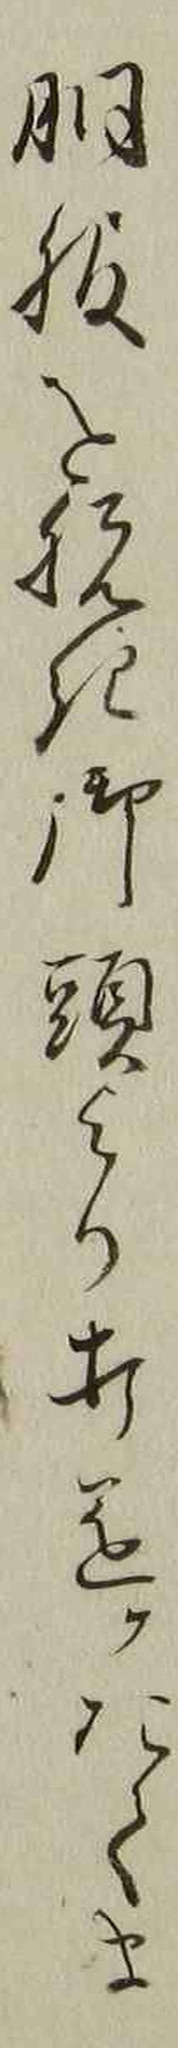胴服を脱き御頭より打懸
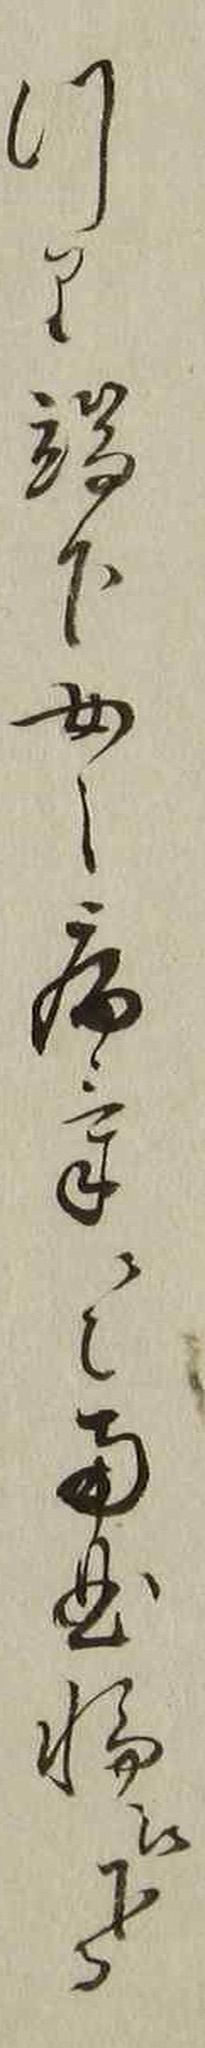つり端下女之病気ニて南曲輪江下る
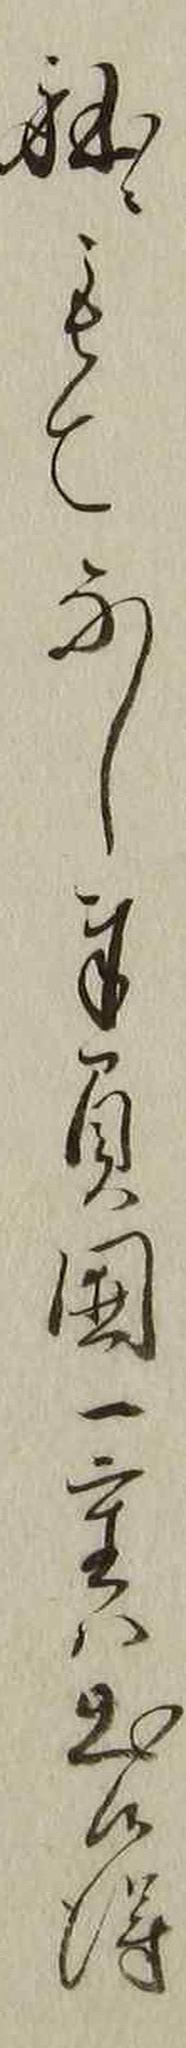躰ニもてなし奉負囲一重ハ出候得
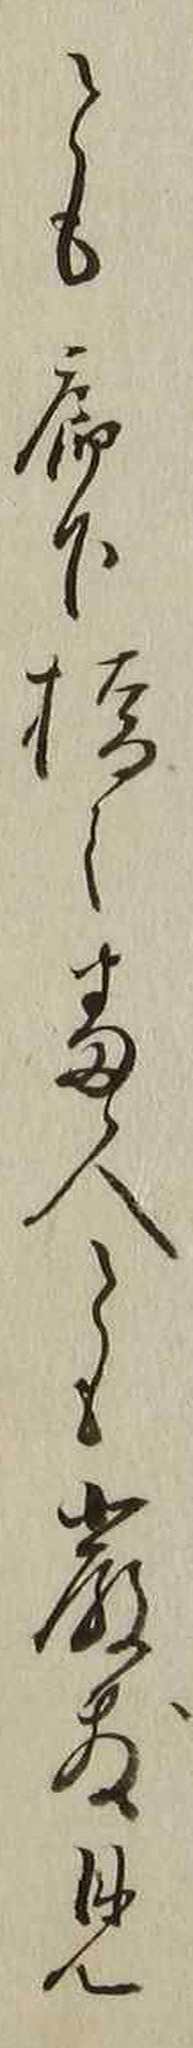とも廊下橋之番人とも厳敷見
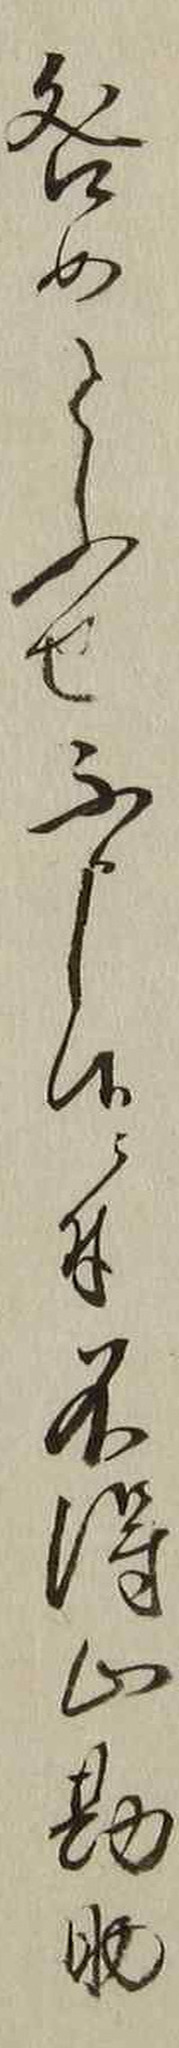咎めとふせ不申候ニ付不得止勘助
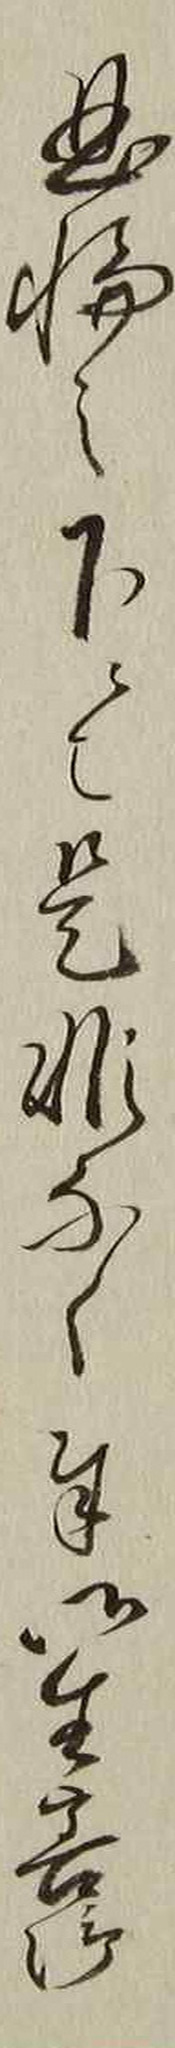曲輪之下ニて是非なく奉御生養御
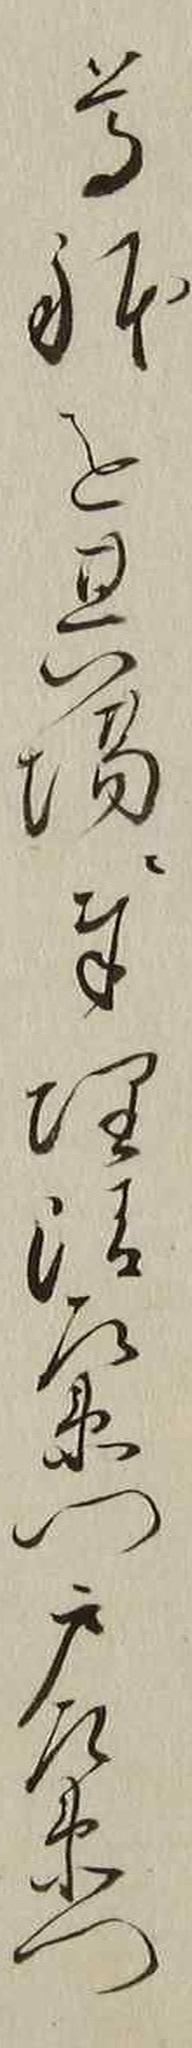尊躰を其場ニ奉埋清左衛門戸左衛門
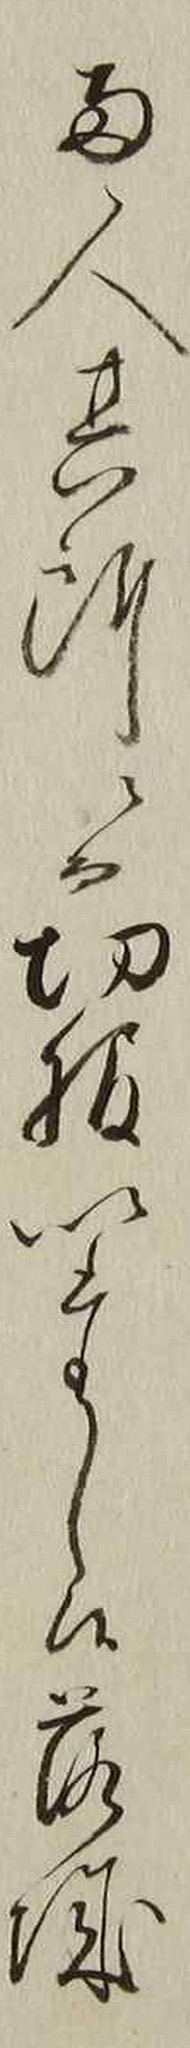両人其所ニ而切腹いたし候落城
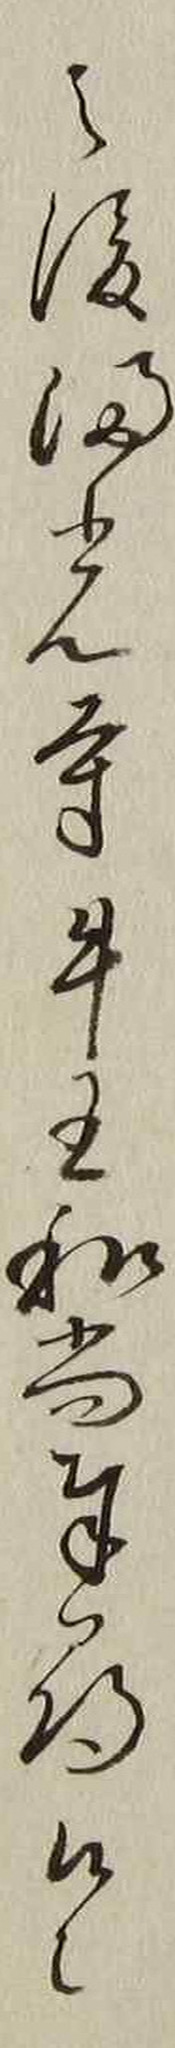之後満光寺牛王和尚奉尋候て

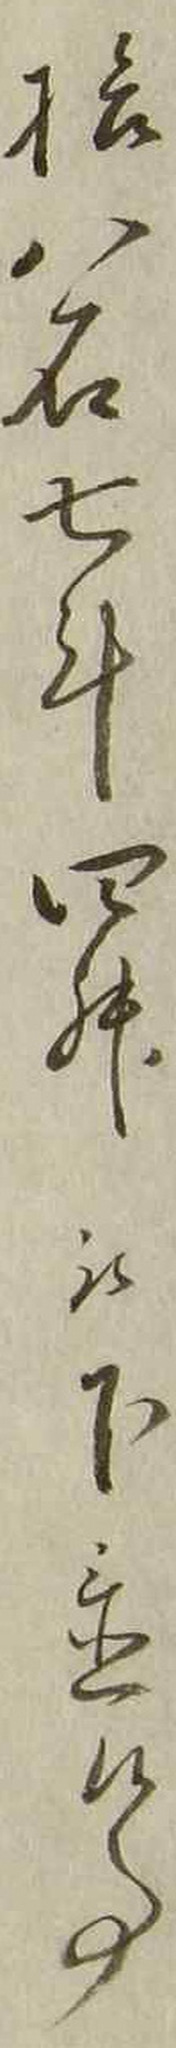拾八石七斗四升被下置候事
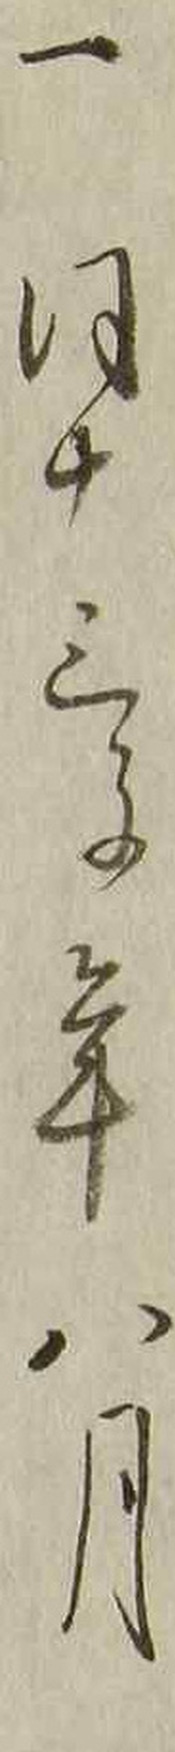一同十三子年八月
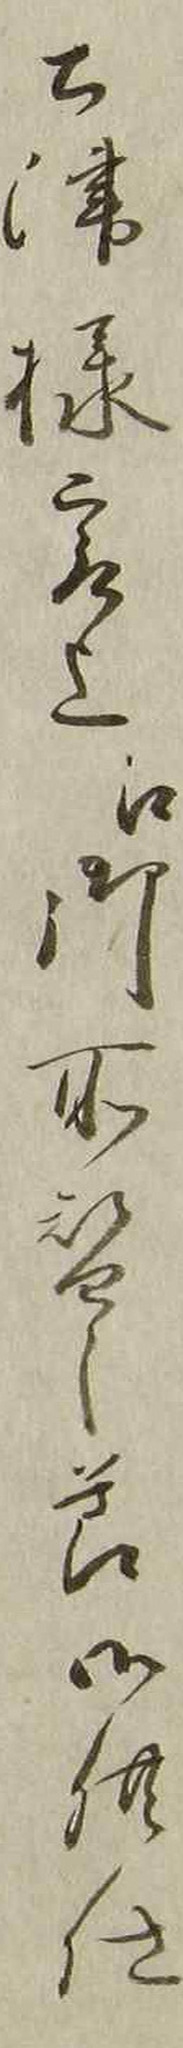土津様最上江御所替之節御供仕
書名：諸士系譜　巻之6　い之部6
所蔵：会津若松市立会津図書館
